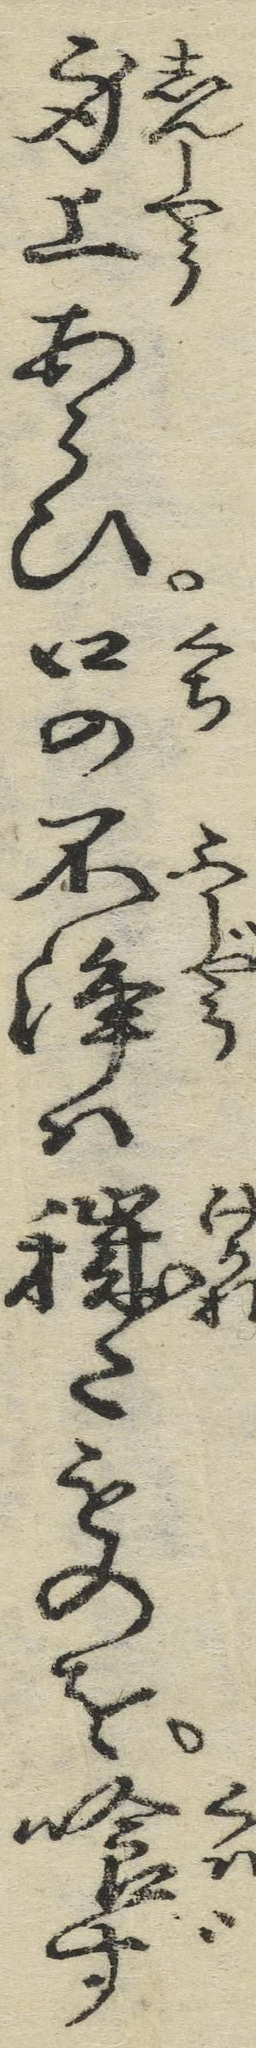身上あらひ。口の不浄は穢たものを。喰ず
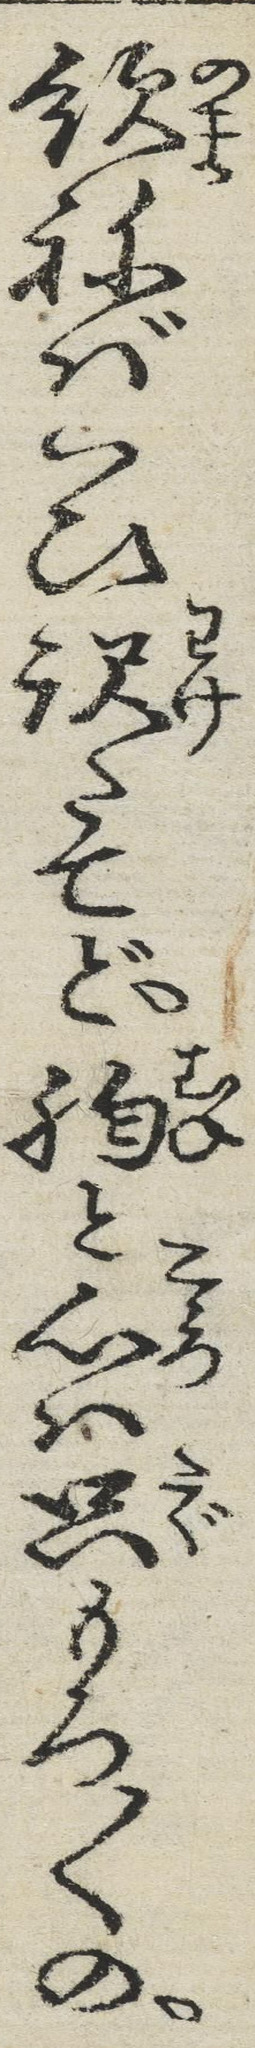飲ねばいひ訳たてど。胸と心は只もろ〳〵の。
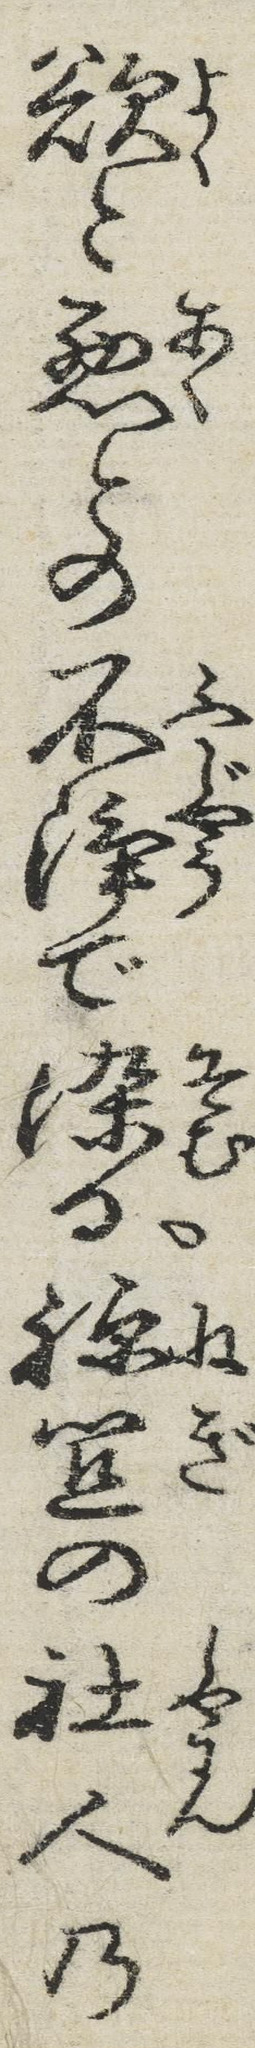慾と悪との不浄で染る。禰宜の社人の
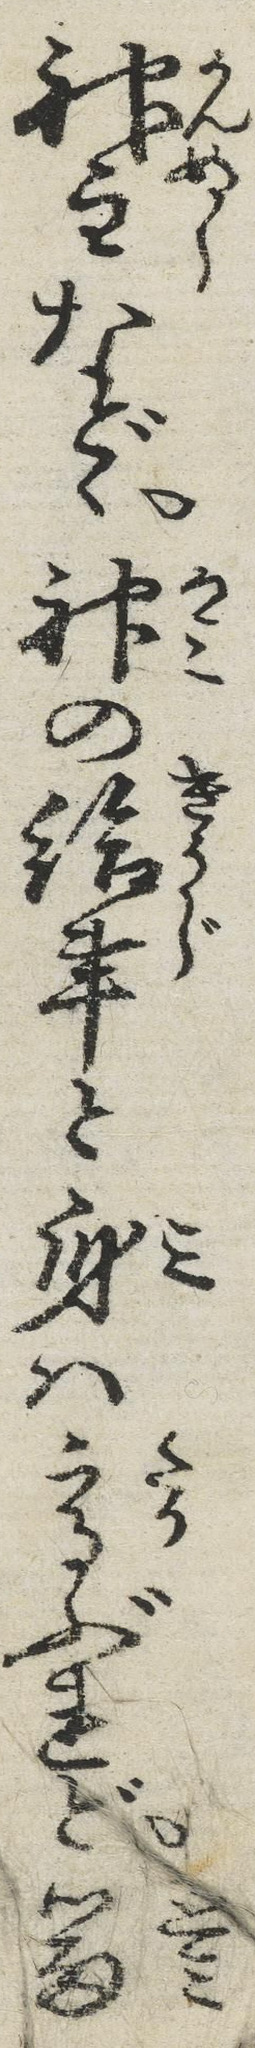神主などヽ。神の給事と身は高ぶれど。富
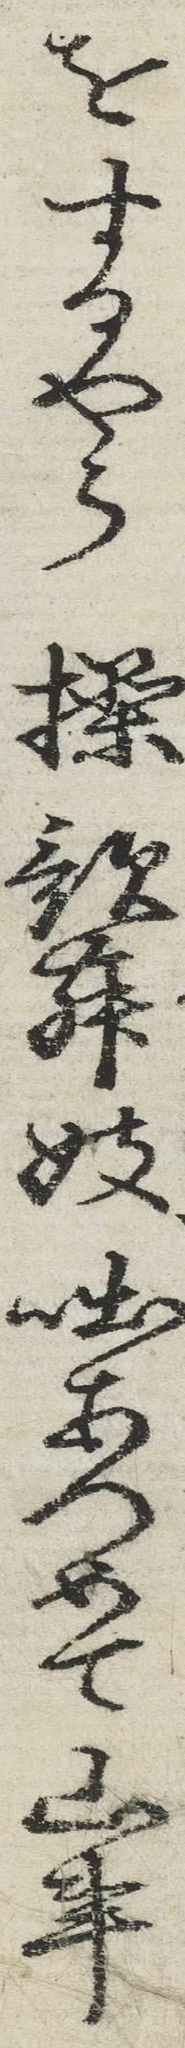をするやら操歌舞伎。咄あつめて山事
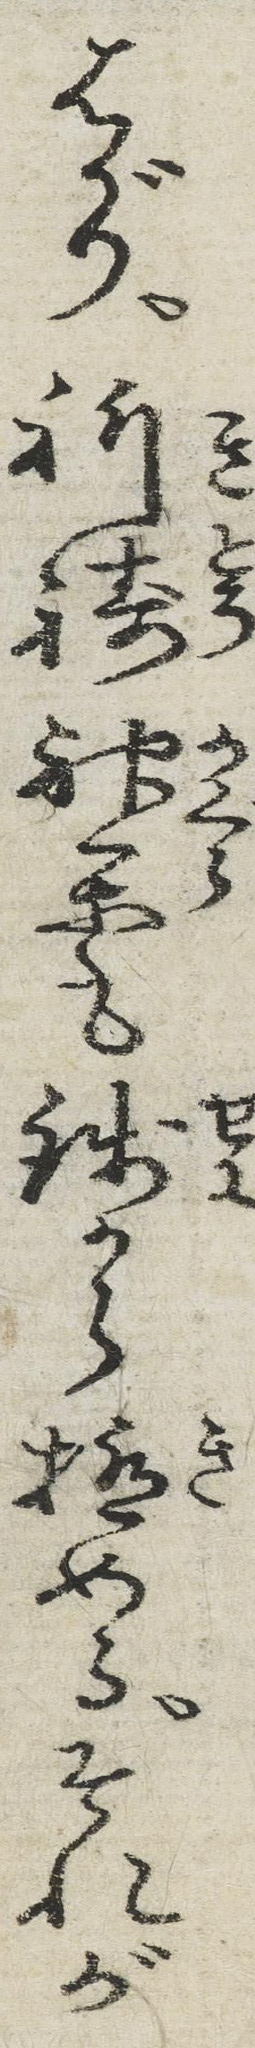はがり。祈祷神楽も銭から極める。それが
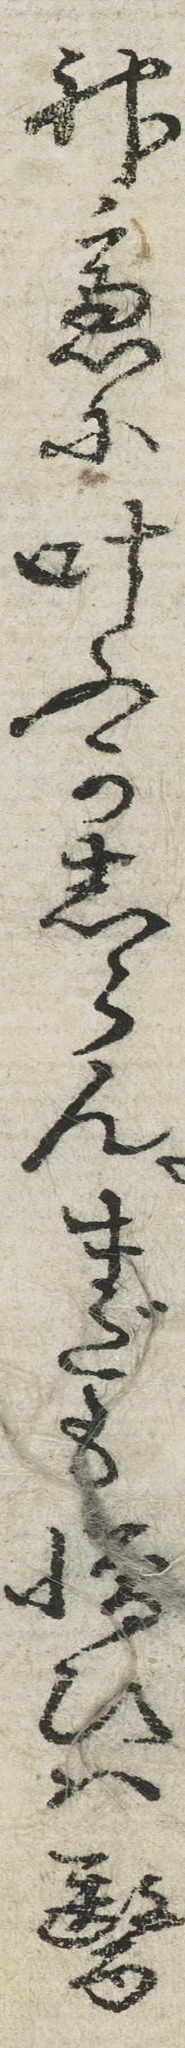神慮に叶ふかしらん。まだも憎ひは医
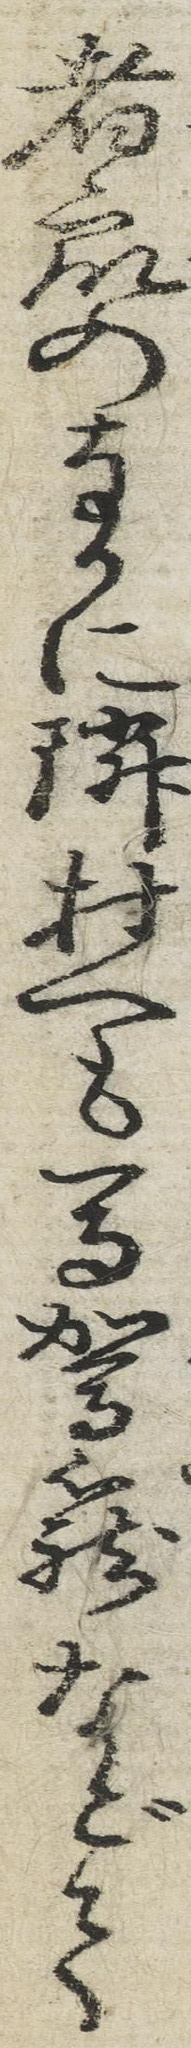者衆のなかに隣村へも馬駕籠などて

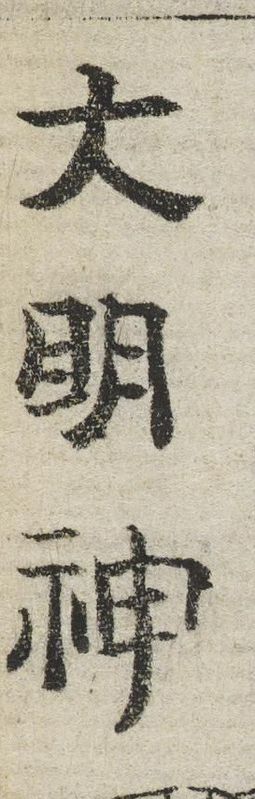大明神

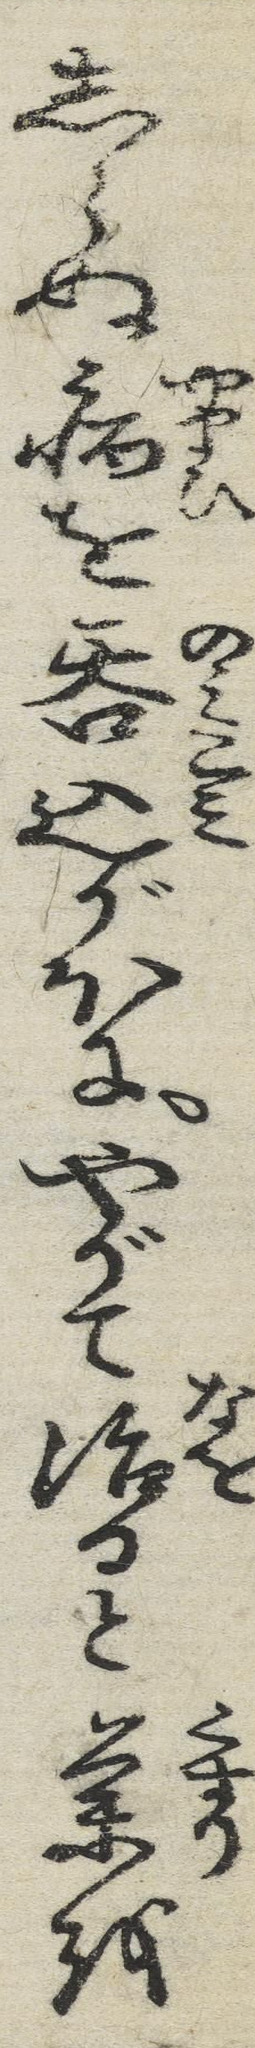しらぬ病を呑込がほに。やがて治ると薬を
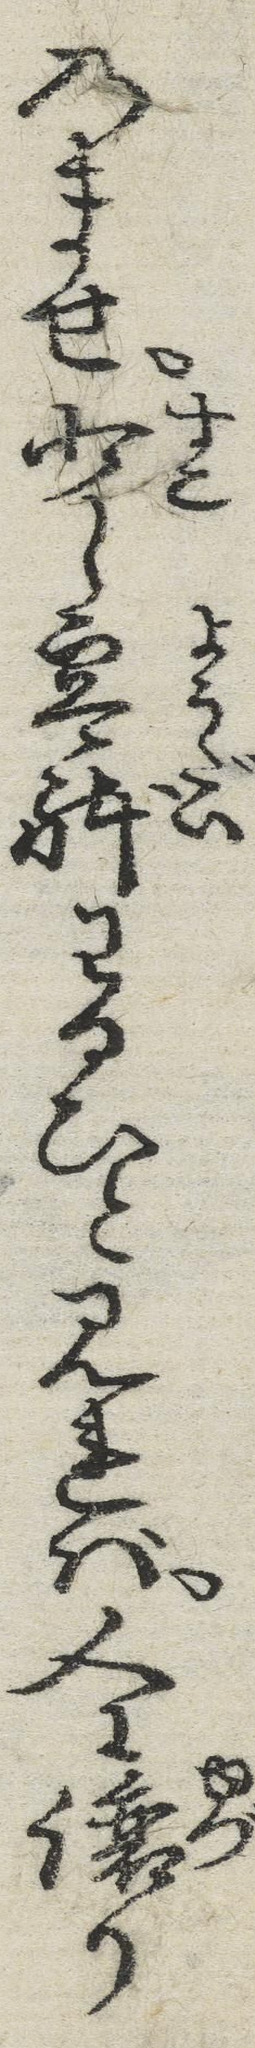のませ。少し容躰わるひと見れば。人に譲り
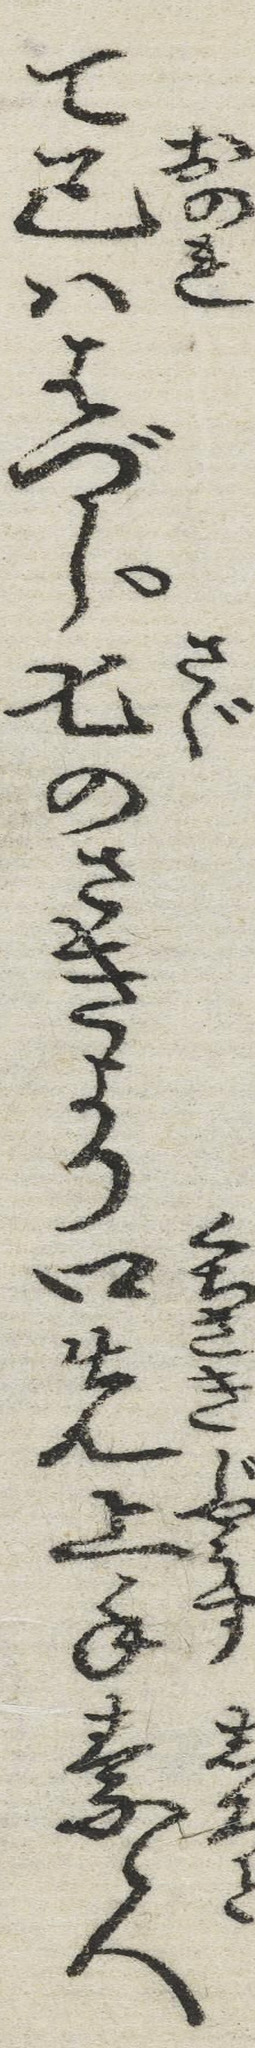て己ははづし。匕のさきより口先上手素人
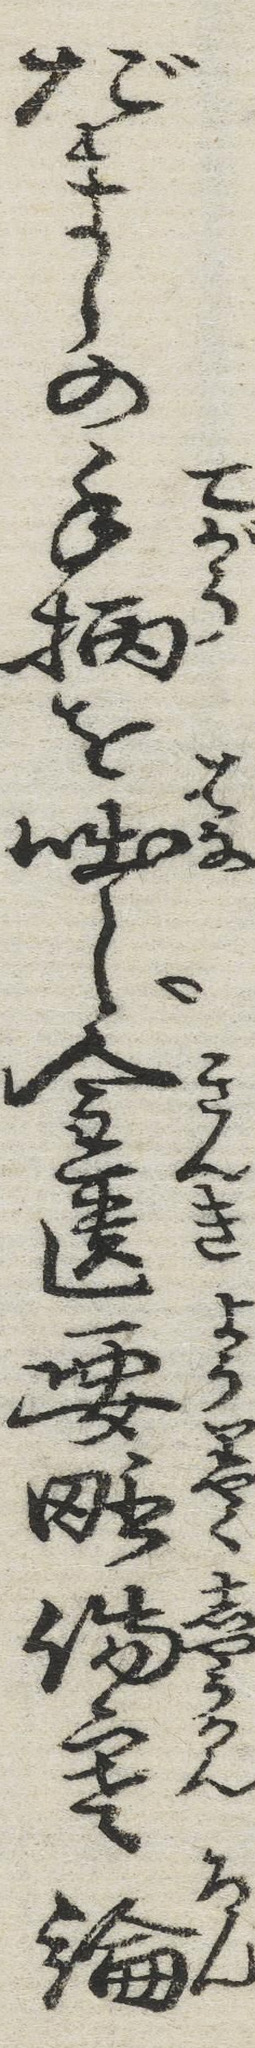だましの手柄を咄し。金匱要略傷寒論
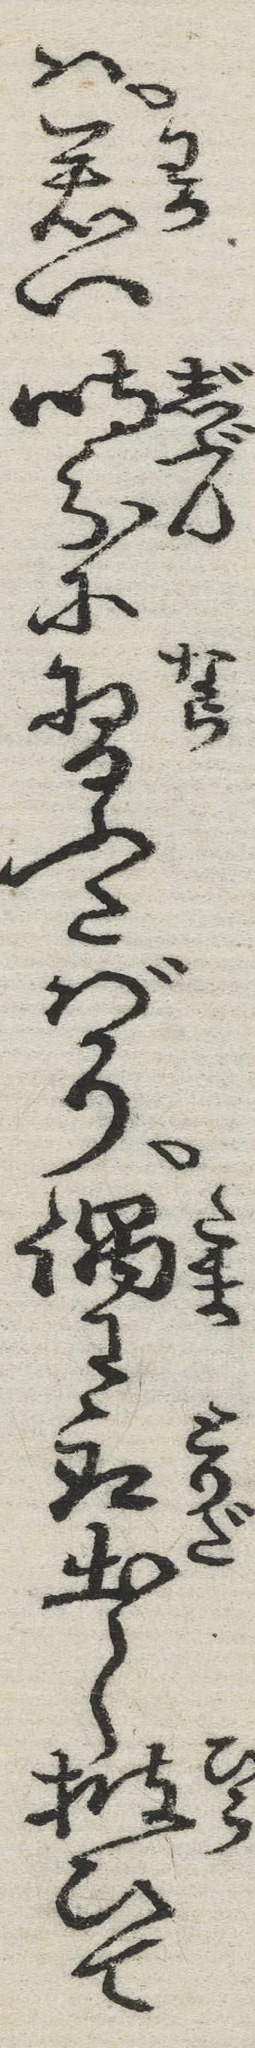は若い時分に習ふたばかり。偶に取出し披ひて
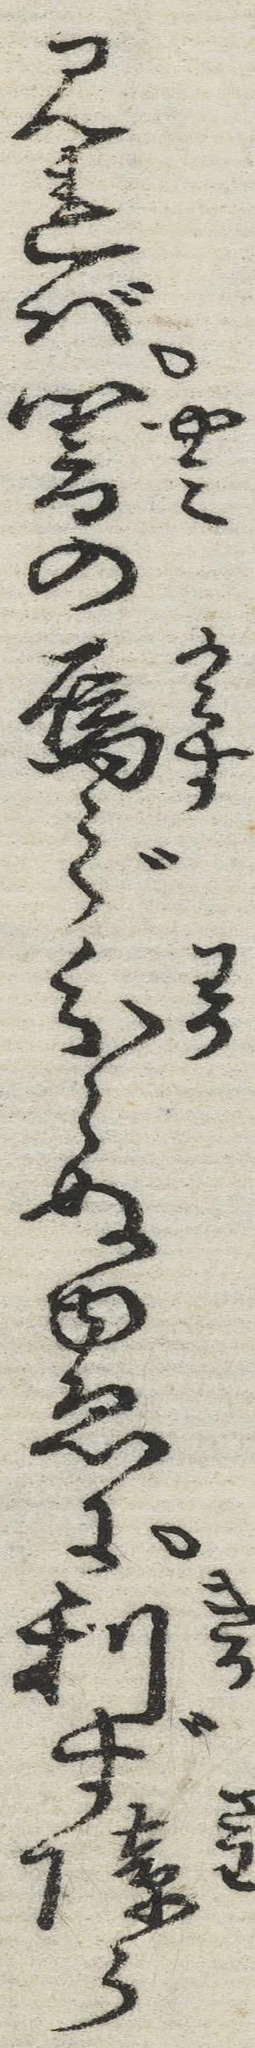見れば。闇の烏で分らぬゆゑに。利ず障ら
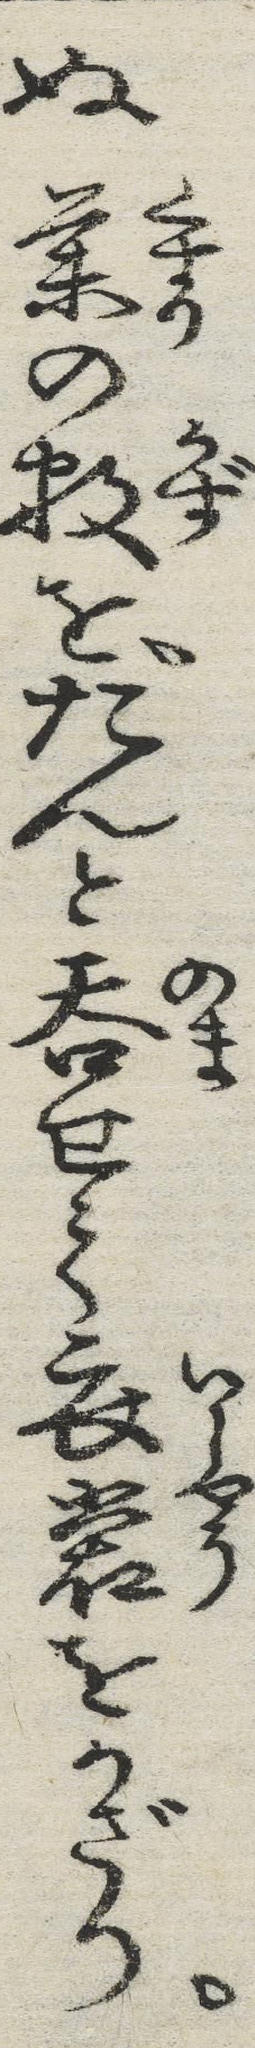ぬ薬の数を。たんと呑せて衣裳をかざり。
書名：越後地震口説
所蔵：東京大学地震研究所図書室 Earthquake Research Institute Library, The University of Tokyo, JAPAN
